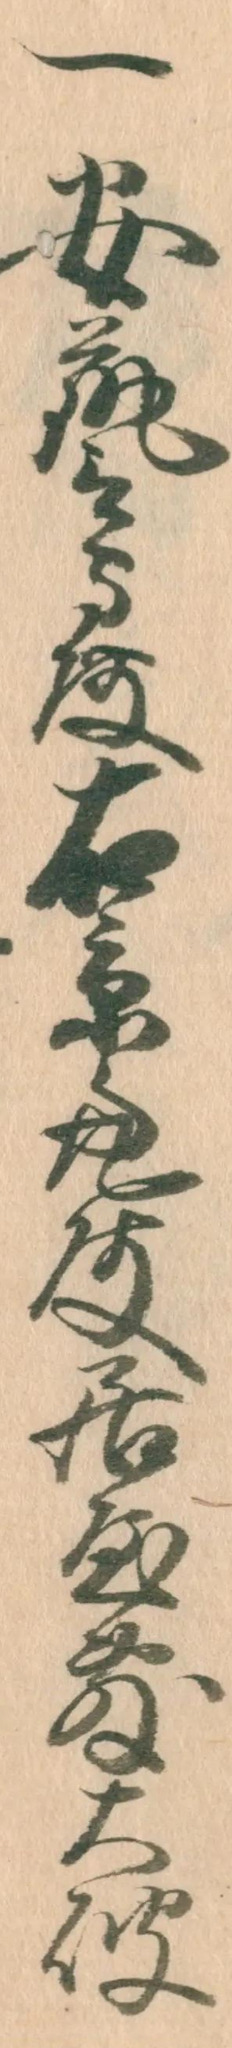一安芸守殿右京亮殿居屋敷大破
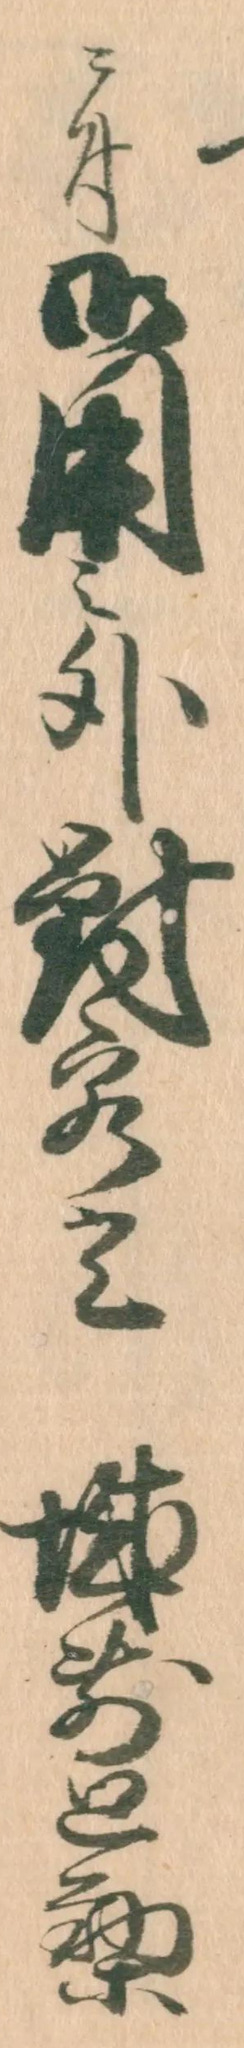ニ付御用之外対客登城前廻勤等
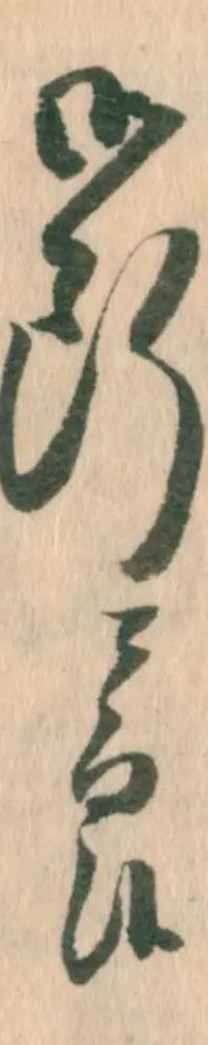御断ニて候
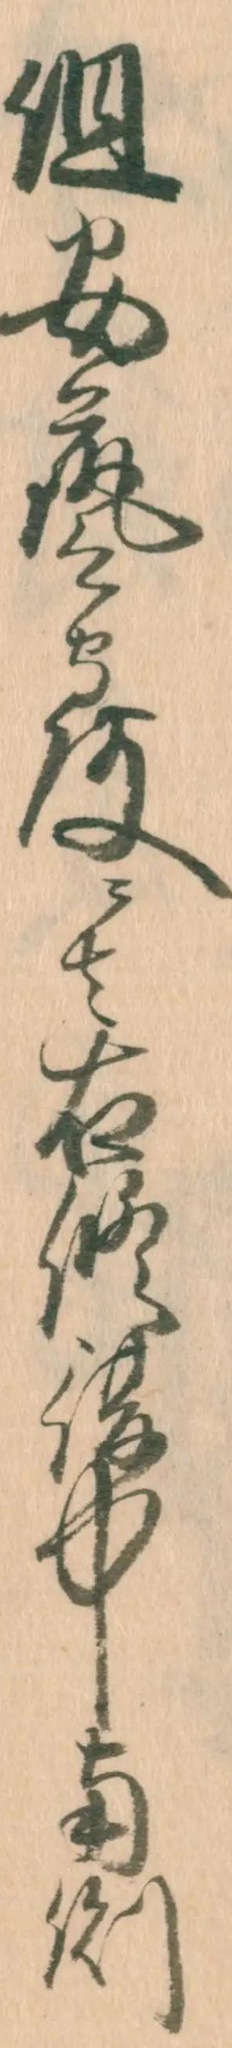但安芸守殿ニは右修復中南側
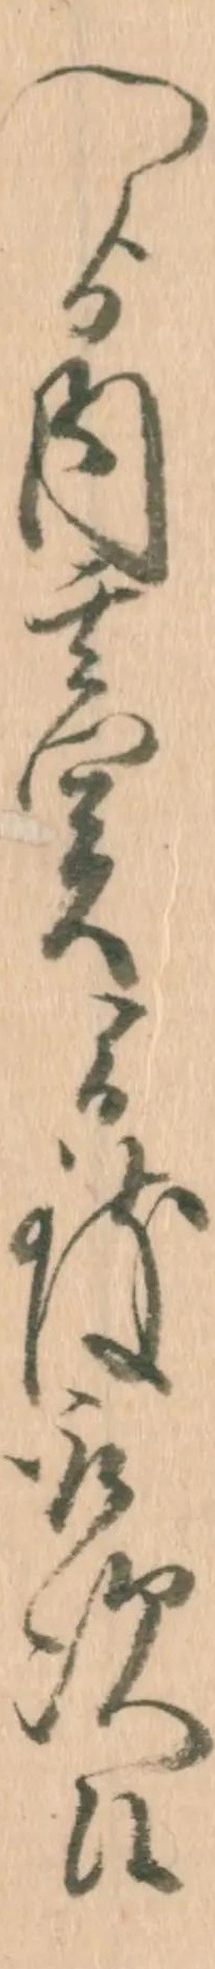門ゟ内玄関ニて致取次候
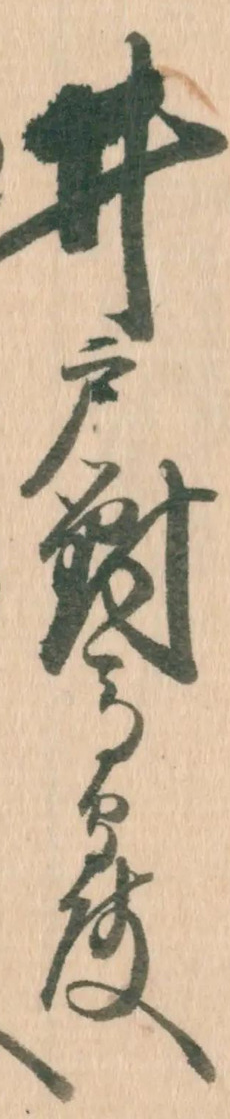井戸対馬守殿
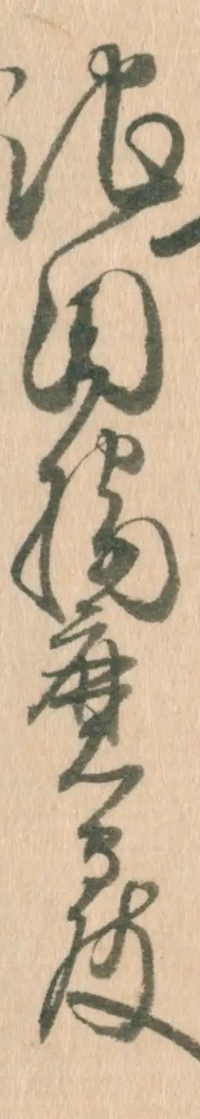池田播磨守殿

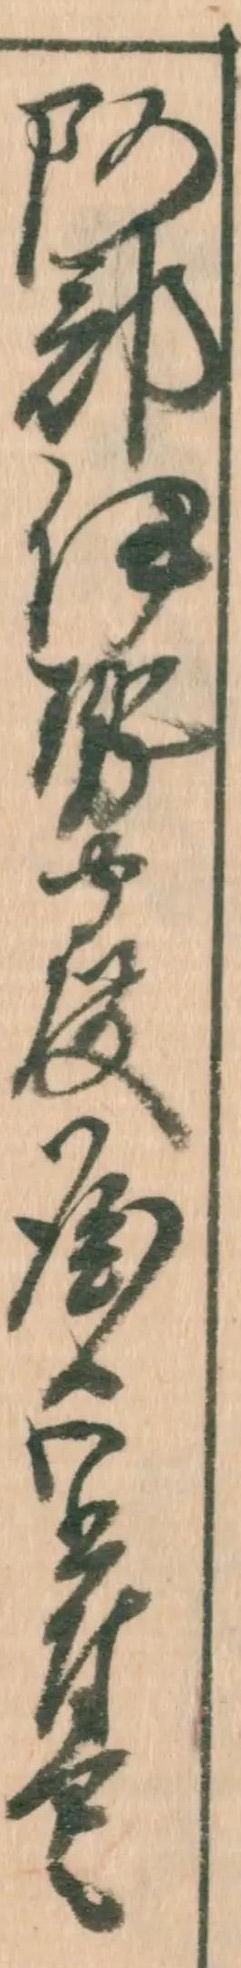│阿部伊勢守殿御渡候御書付写
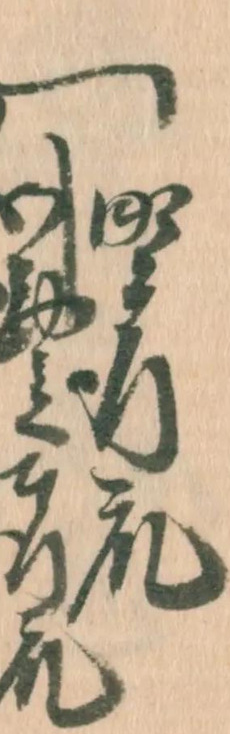││町奉行衆
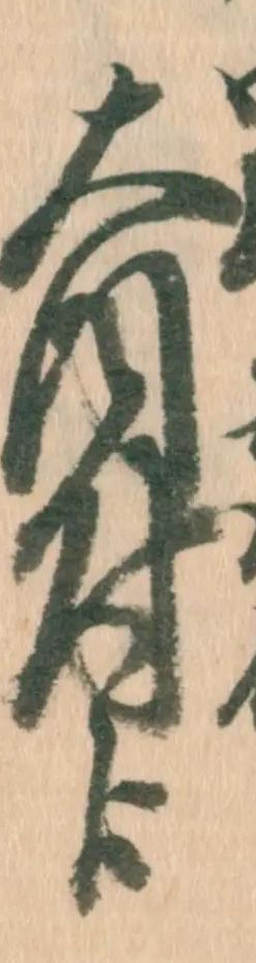│大目付え
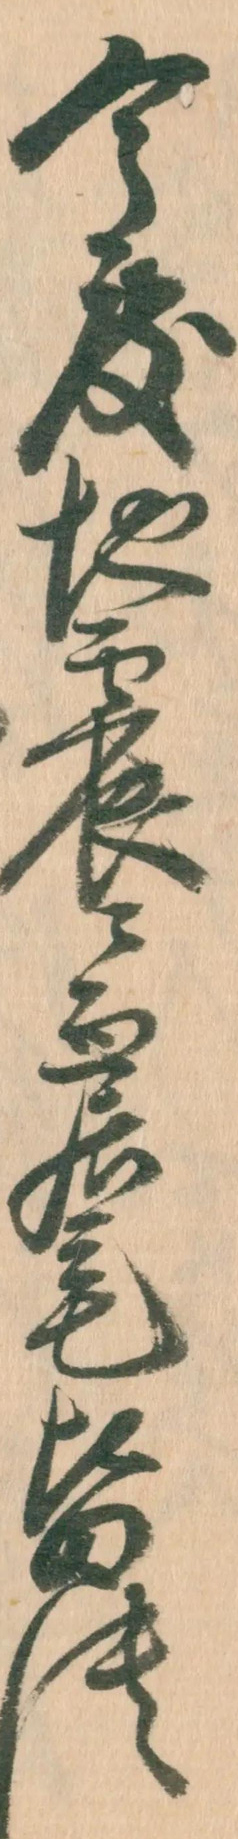今度地震ニて居宅皆潰
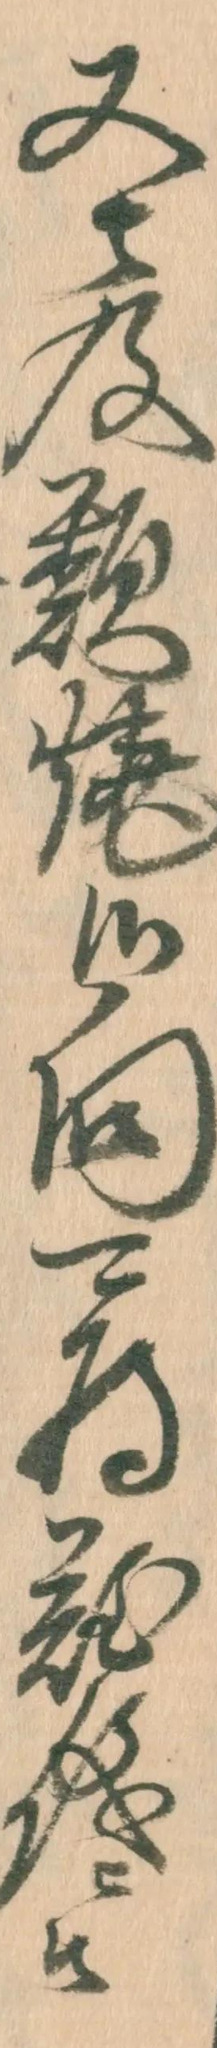又は及類焼候向可為難儀ニ被
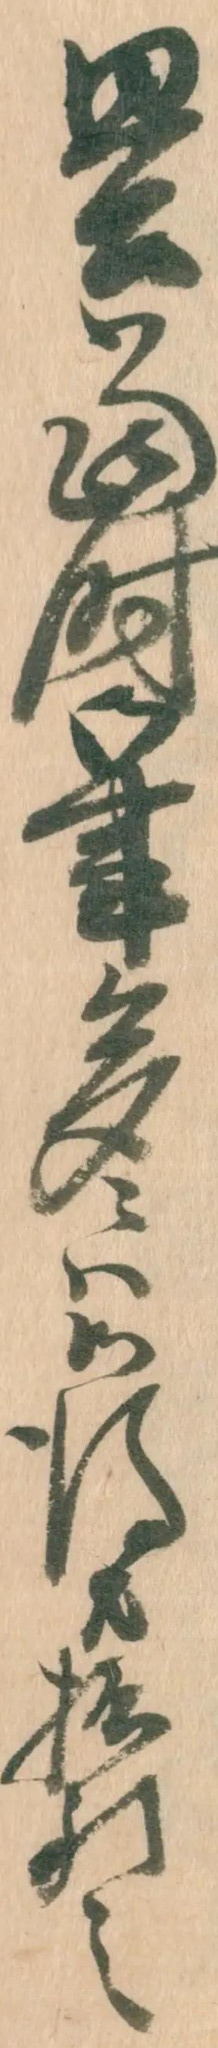思召当時御事多ニハ候得共格別之

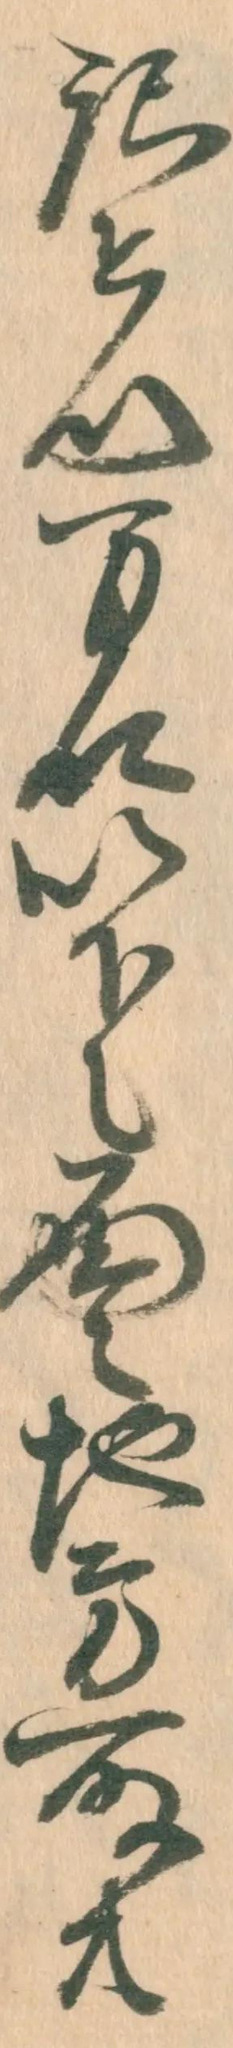訳を以万石以下之面〻地方取共
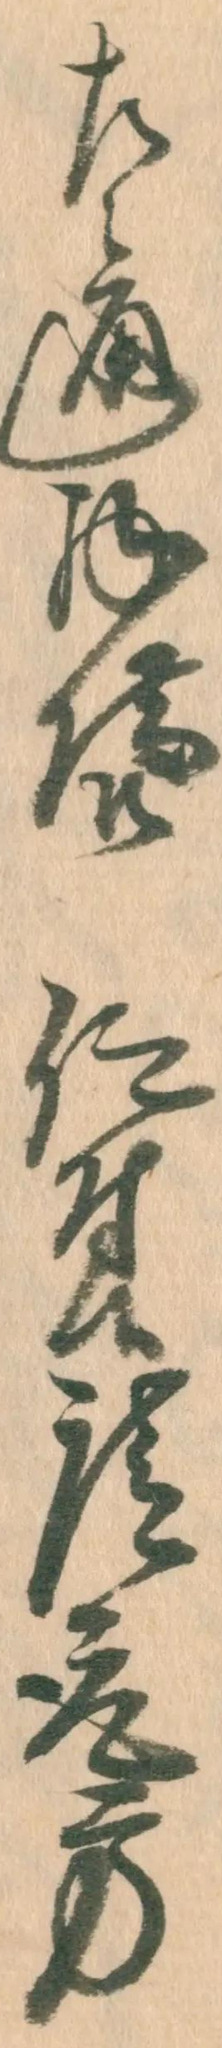左之通拝借被仰付候請取方
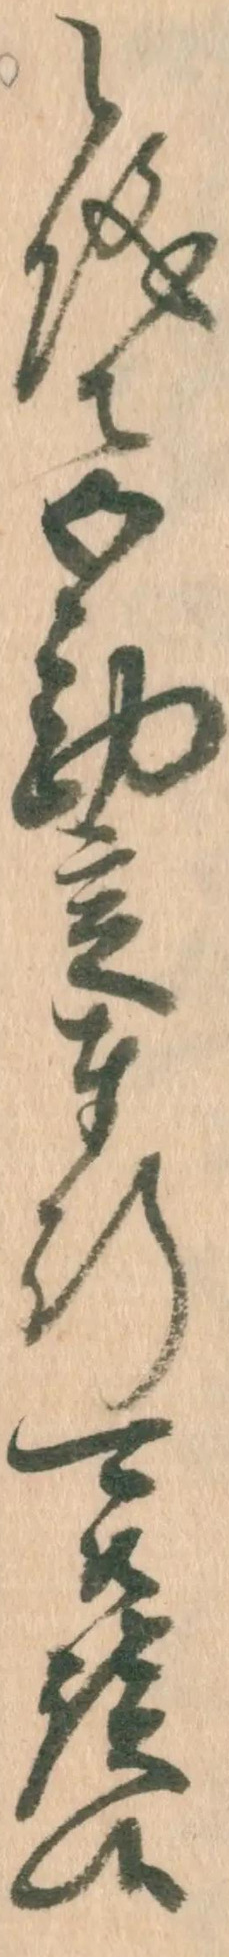之儀は御勘定奉行可被談候
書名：地震災書留 2巻. [2] 内表紙に「地震一件　安政二卯年十月」とあり
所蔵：国立国会図書館 National Diet Library, JAPAN
